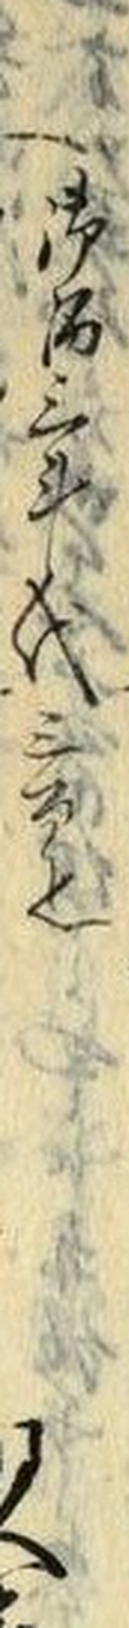御酒三斗代三百疋
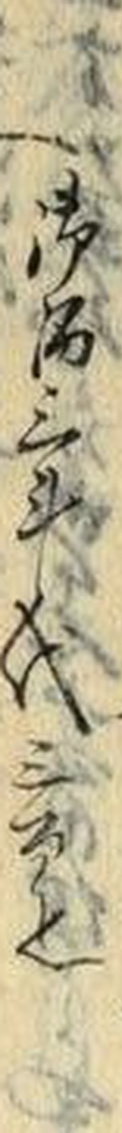御酒三斗代三百疋
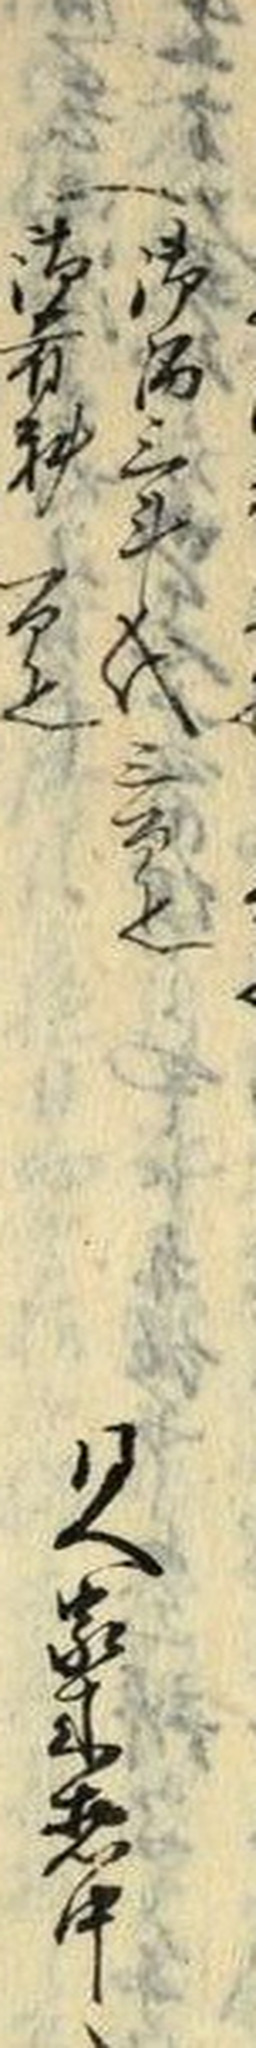御肴料百疋同人家来惣中へ
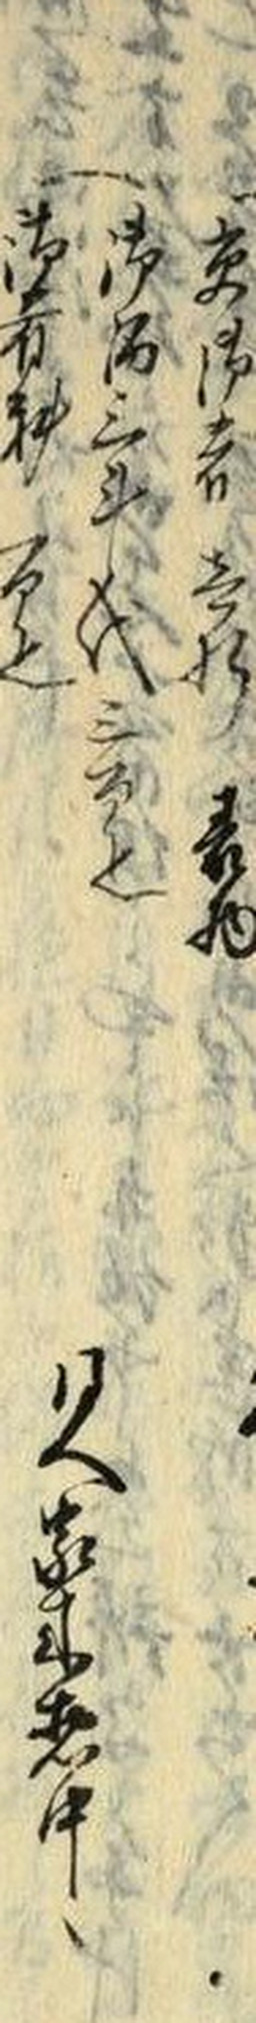御肴料百疋同人家来惣中へ
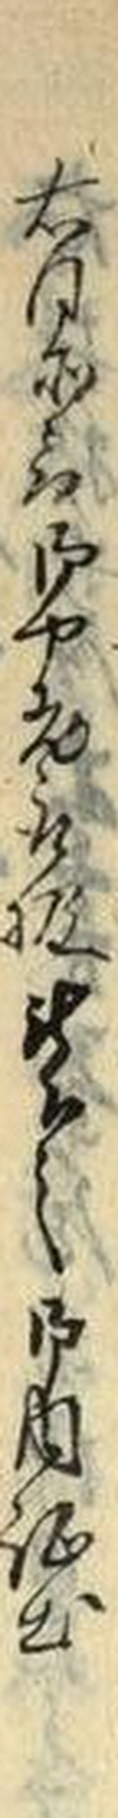右同所ニ而御中老取扱被下之御内証出
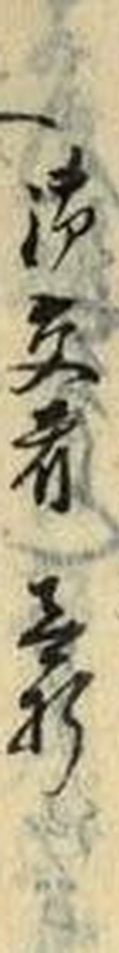御交肴壱折
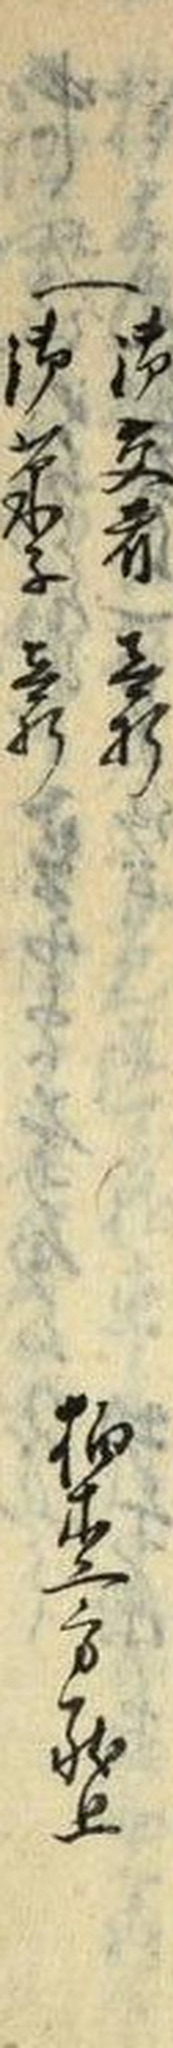御菓子壱折狛木工方献上
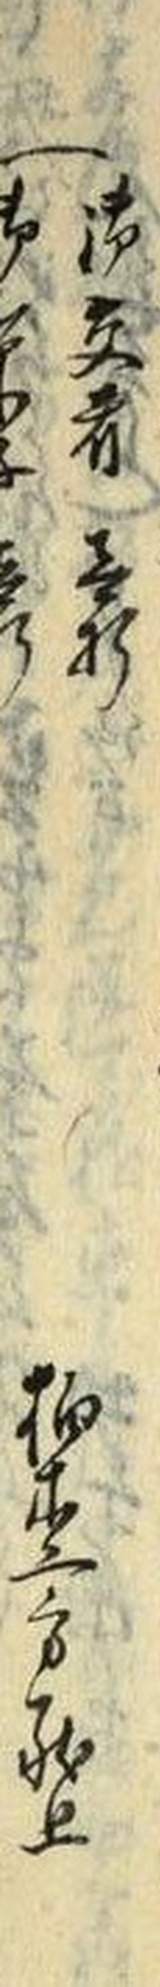御菓子壱折狛木工方献上
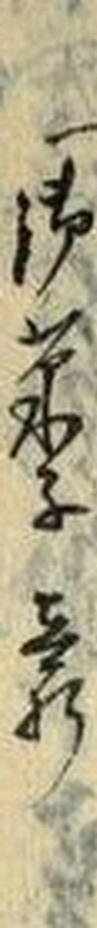御交肴壱折
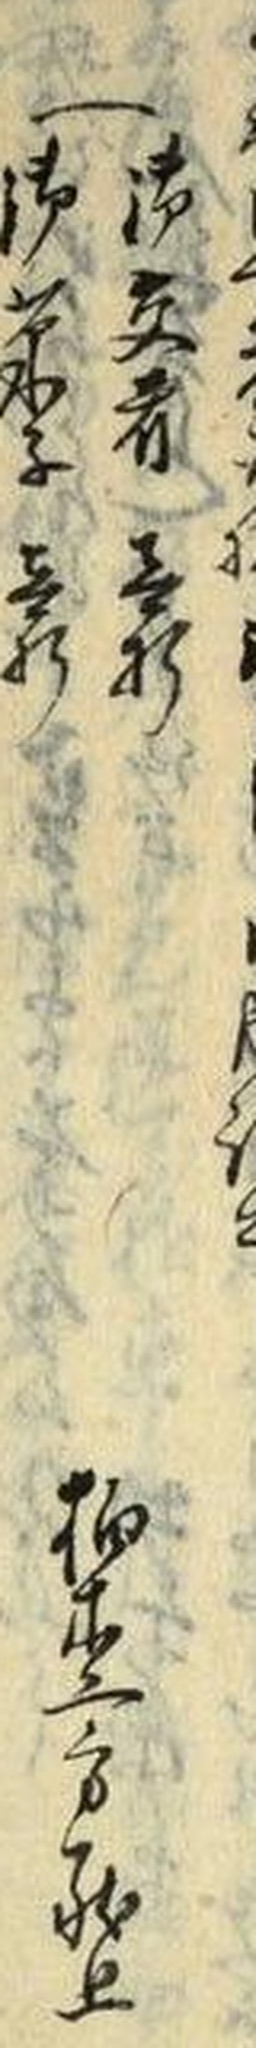御菓子壱折狛木工方献上
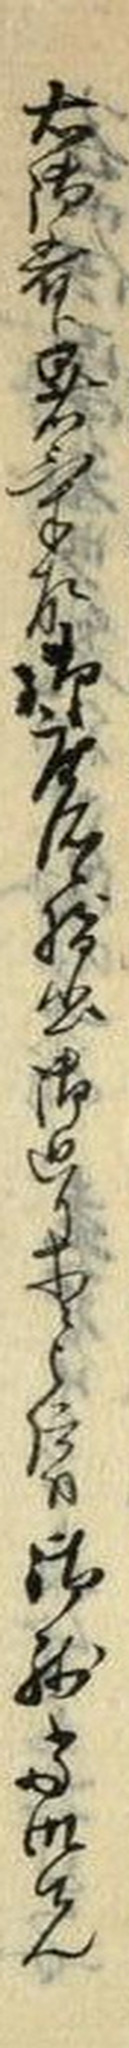右御肴ハ暑気故御座所へ指出御廻り等ニ被仰付御残当御先

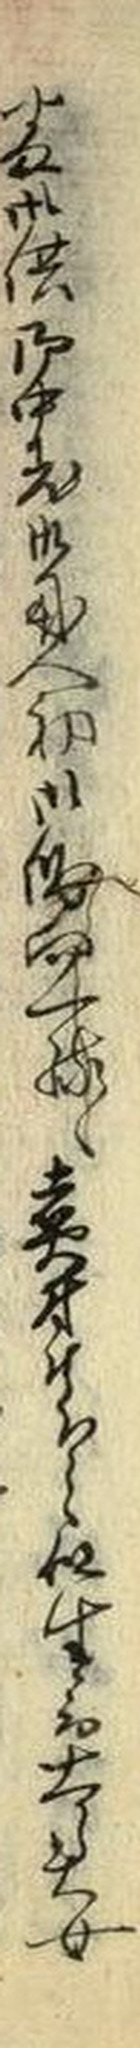番御供御中老御用人初御側向一統へ煮付被下之但生ニ而大奥女
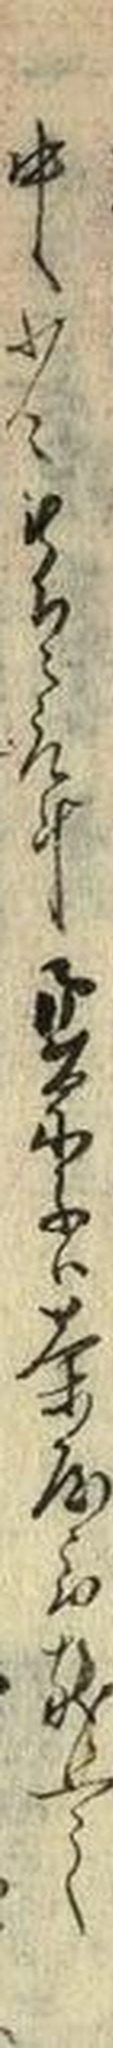中へ少々被下ニ取計御菓子ハ御茶屋ニ而献上之
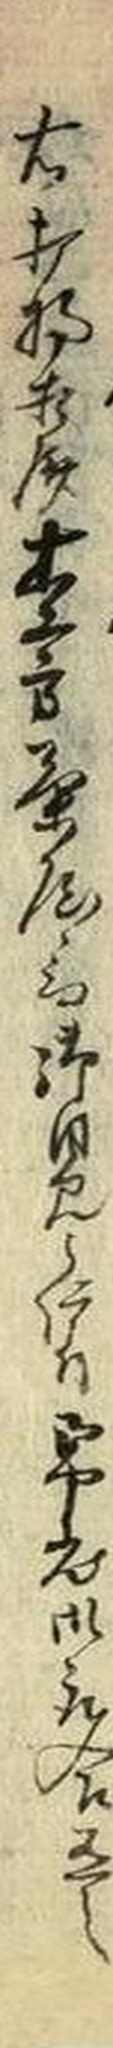右打揚相済木工方茶屋ニ而御目見被仰付御中老御取合有之
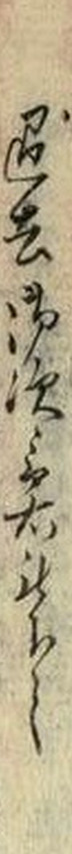退去御次ニ而右被下之
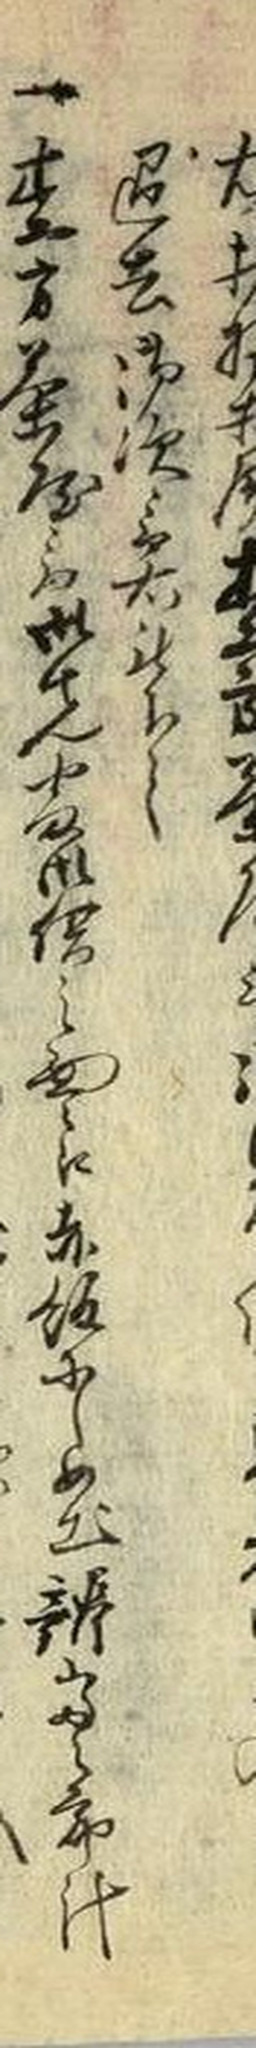一木工方茶屋ニ而御先番御供之面々江赤飯にしめ出弁当之節汁
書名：少傅日録抄（斉承付側向頭取日記、在国）
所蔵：福井県文書館 Fukui Prefectural Archives
